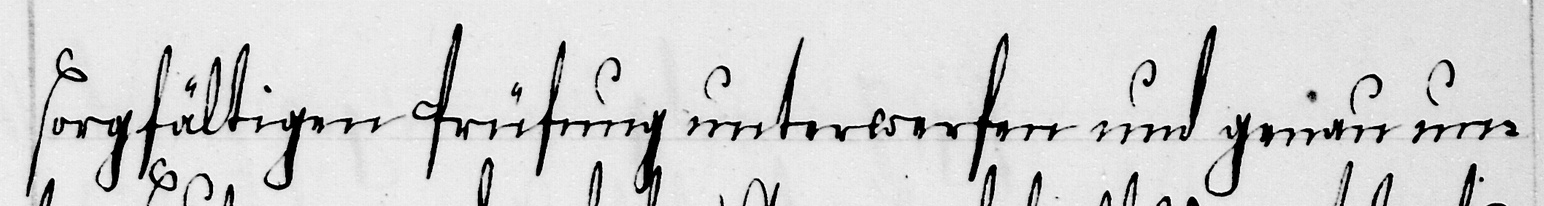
sorgfältigen Prüfung unterwerfen und genau un¬
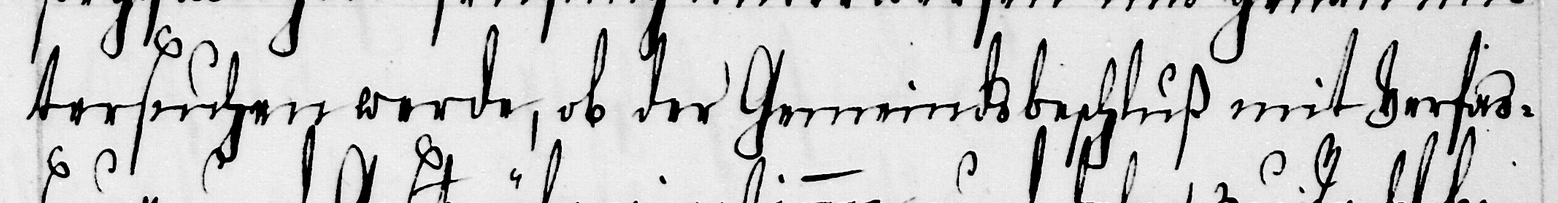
tersuchen werde, ob der Gemeindsbeschluß mit Verfaß¬
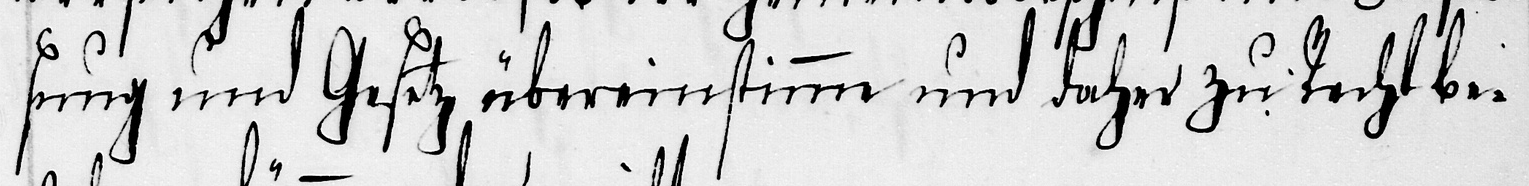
ung und Gesetz übereinstimme und daher zu Recht be¬
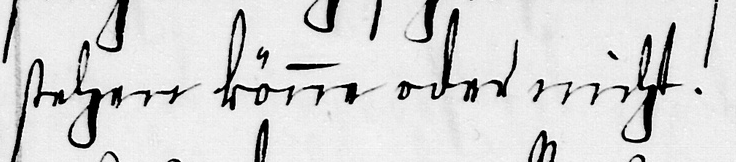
stehen könne oder nicht.
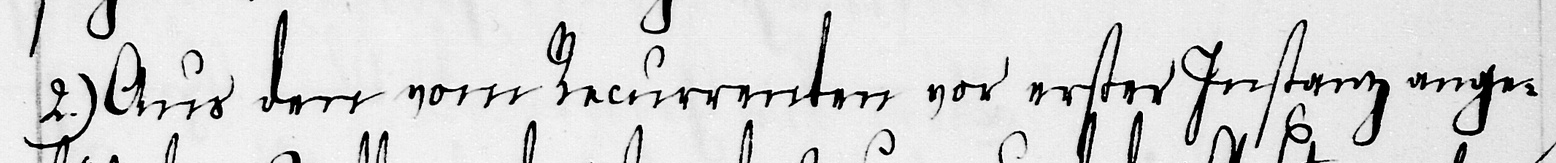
2.) Aus den vom Recurrenten vor erster Instanz ange¬
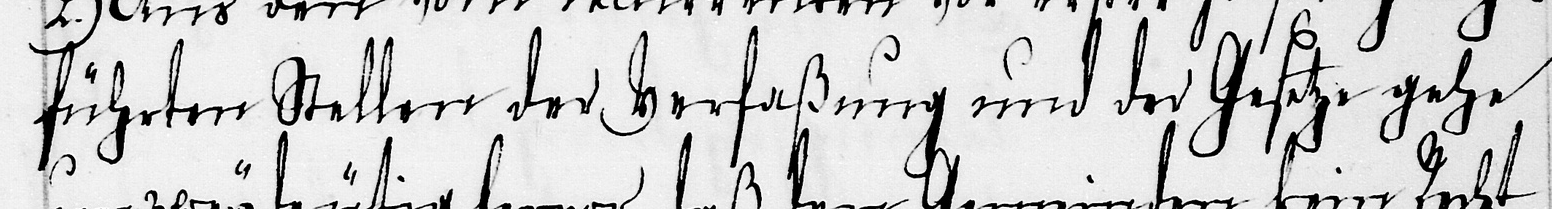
führten Stellen der Verfaßung und der Gesetze gehe
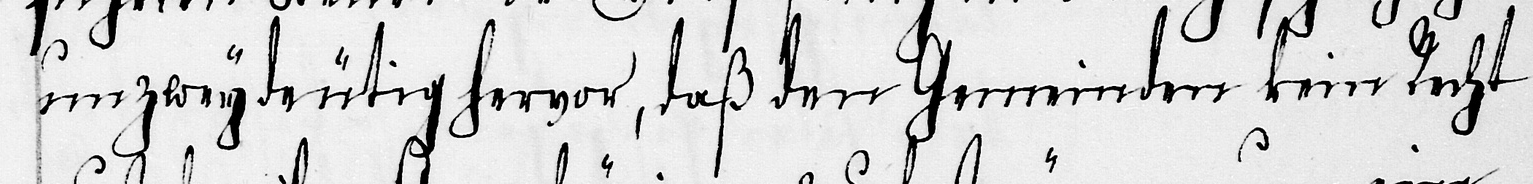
unzweydeutig hervor, daß den Gemeinden kein Recht
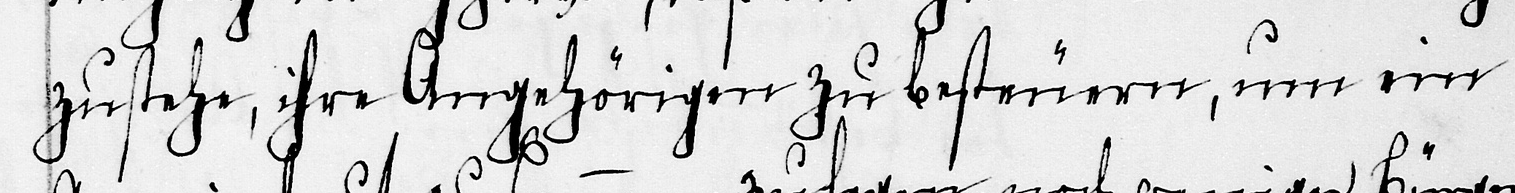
zustehe, ihre Angehörigen zu besteuern, um ein
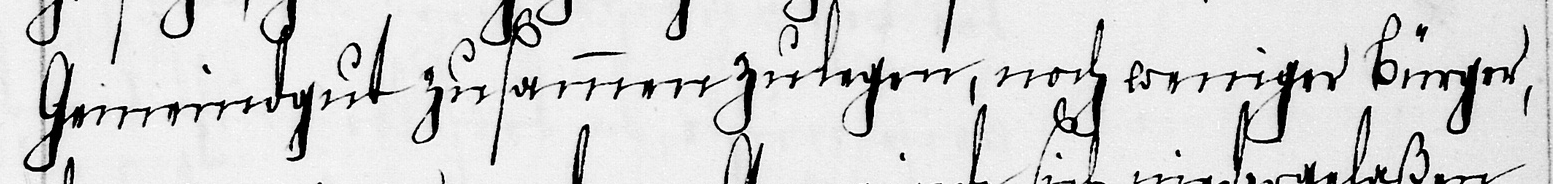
Gemeindgut zusammen zulegen, noch weniger Bürger,
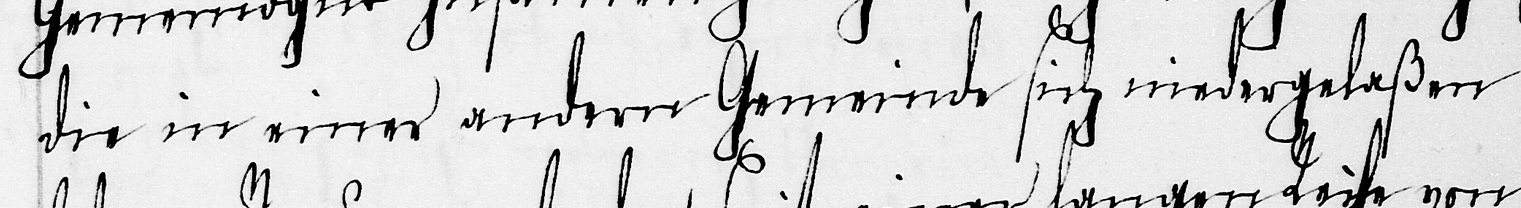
die in einer andern Gemeinde sich niedergelaßen
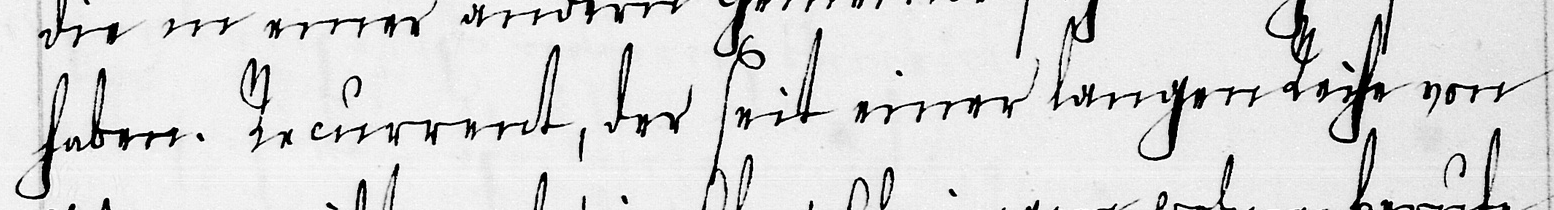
haben. Recurrent, der seit einer langen Reihe von
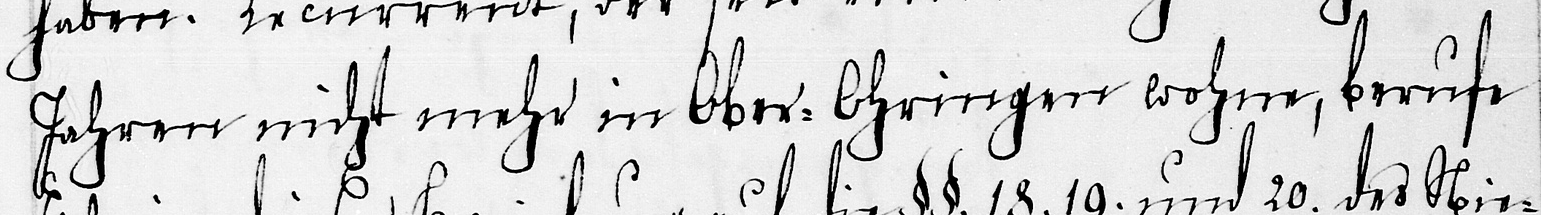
Jahren nicht mehr in Ober-Ohringen wohne, berufe
